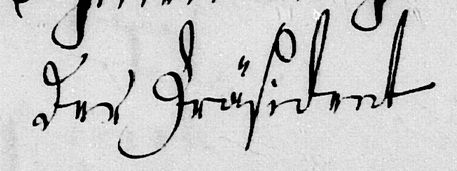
Der Präsident
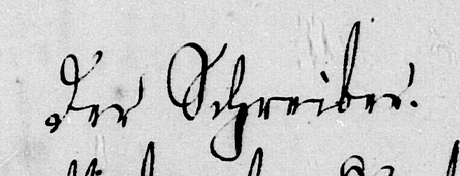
Der Schreiber
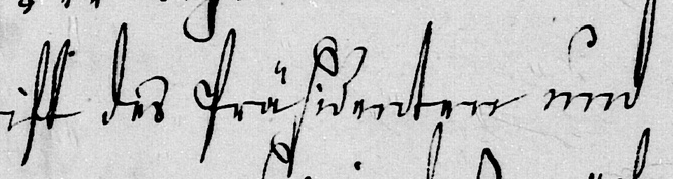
ft des Präsidenten und
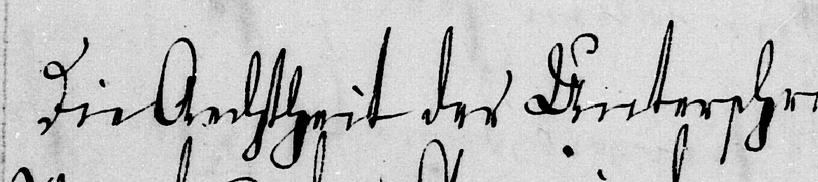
Die Aechtheit der Untersch¬
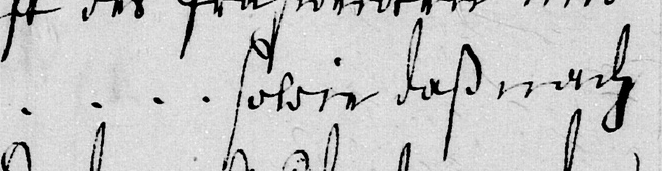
… sowie daß nach
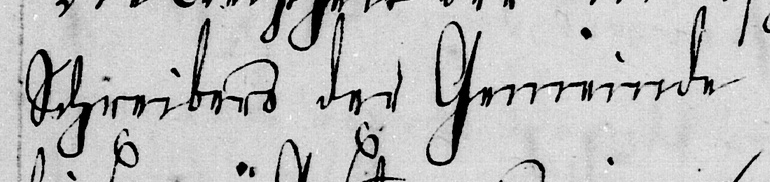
Schreibers der Gemeinde
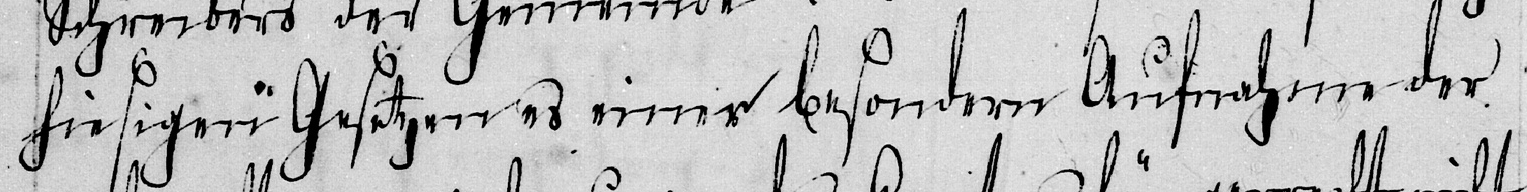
hiesigen Gesetzen es einer besondern Aufnahme der
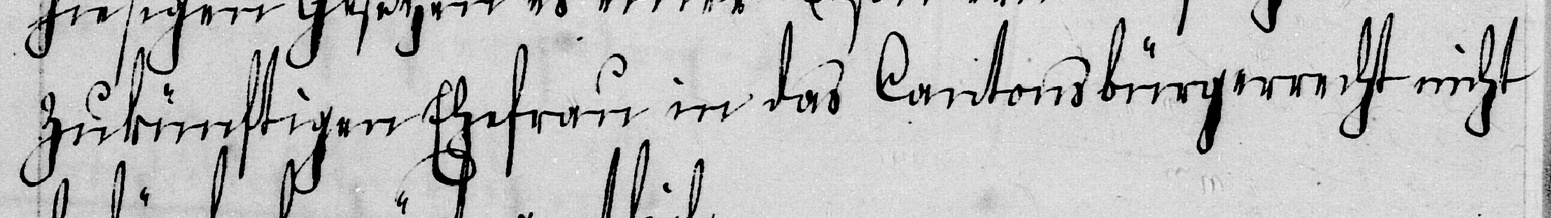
zukünftigen Ehefrau in das Cantonsbürgerrecht nicht
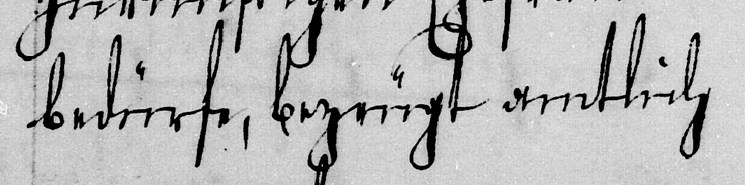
bedürfe, bezeugt amtlich
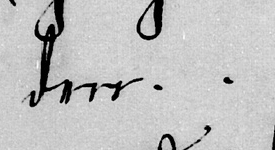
den .
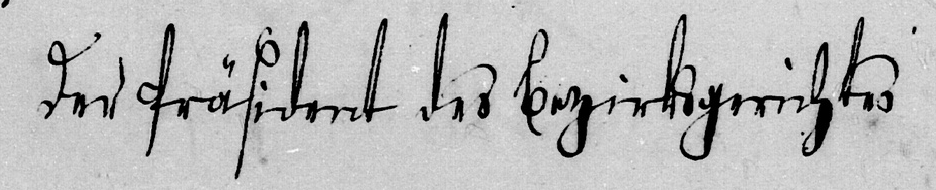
Der Präsident des Bezirksgerichtes
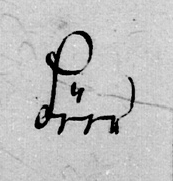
des
